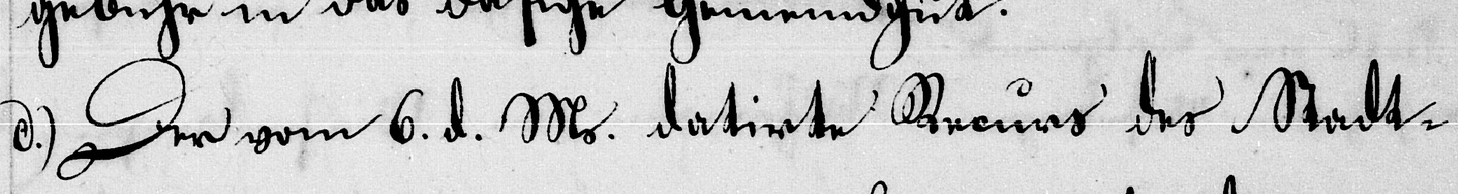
d.) Der vom 6. d. Ms. datirte Recurs des Stadt¬
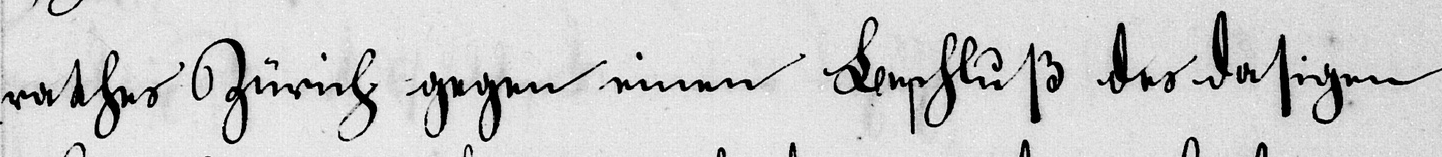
rathes Zürich gegen einen Beschluß des dasigen
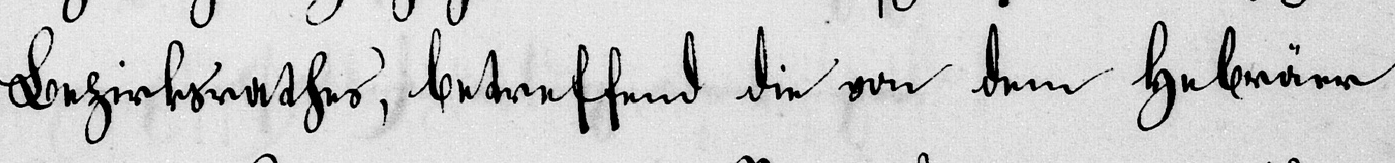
Bezirksrathes, betreffend die von dem Hebräer
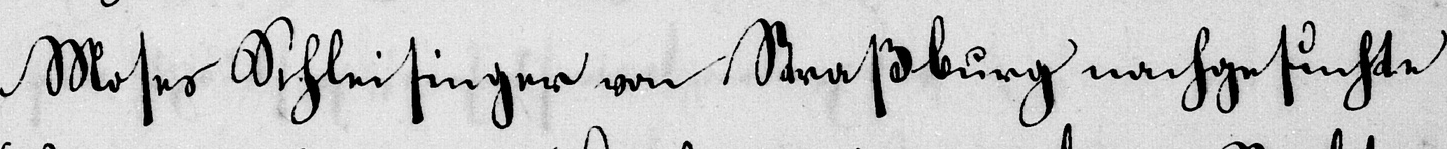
Moses Schleisinger von Straßburg nachgesuchte
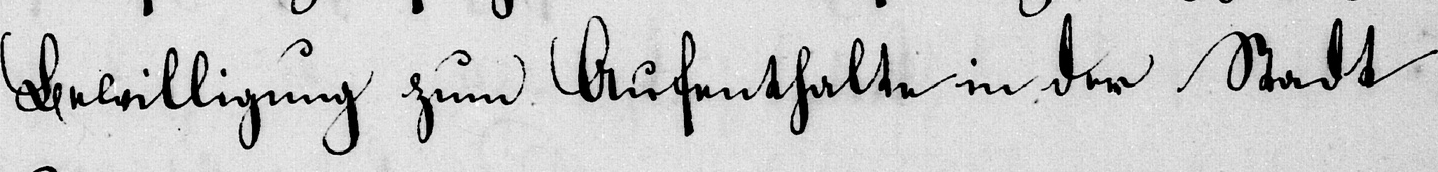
Bewilligung zum Aufenthalte in der Stadt
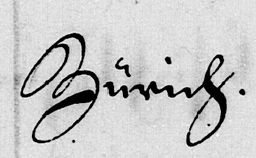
Zürich.
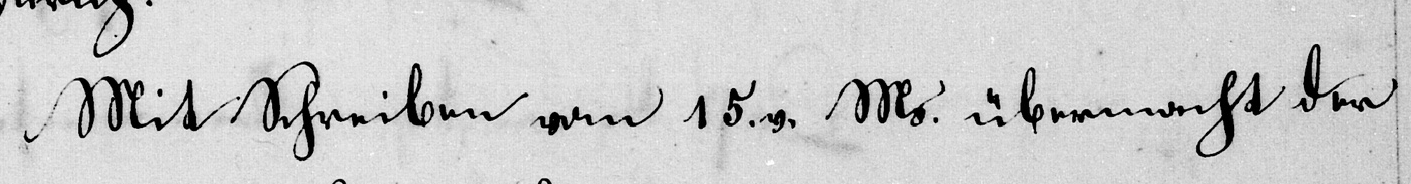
Mit Schreiben vom 15. v. Ms. übermacht der
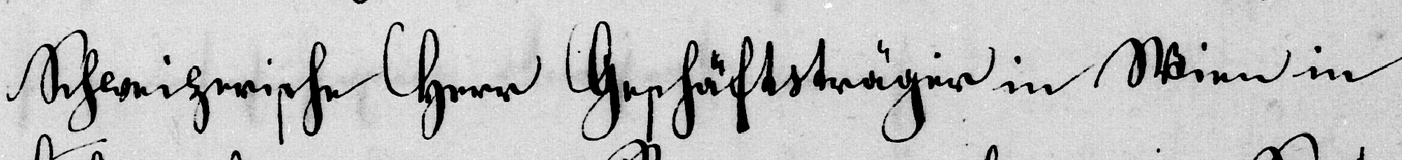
Schweizerische Herr Geschäftsträger in Wien in
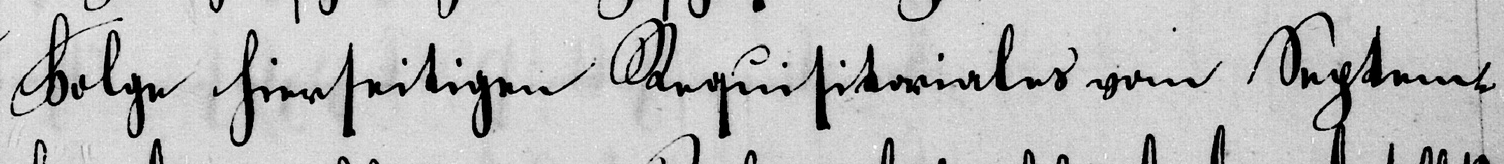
Folge hierseitigen Requisitoriales vom Septem¬
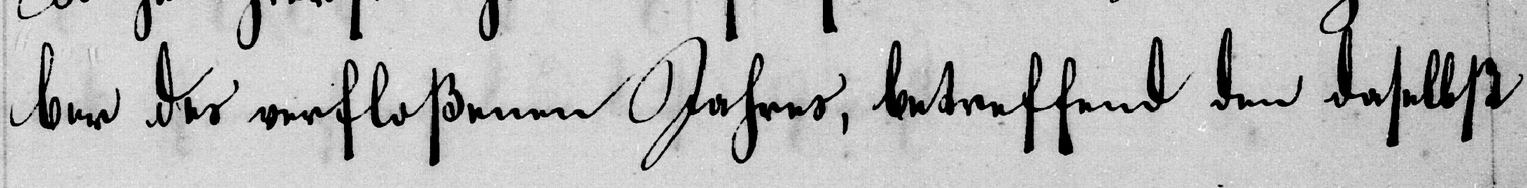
ber des verfloßenen Jahres, betreffend den daselbst
